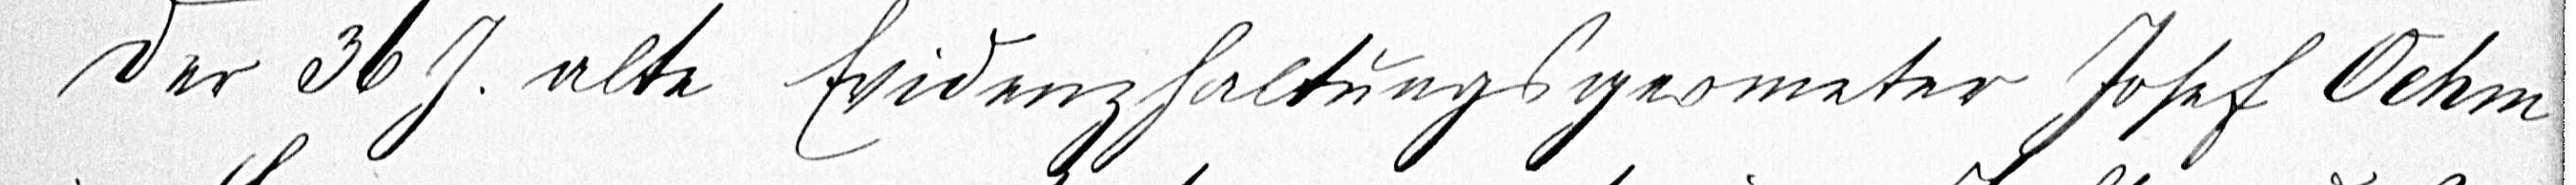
Der 36 J. alte Evidenzhaltungsgeometer Josef Oehm
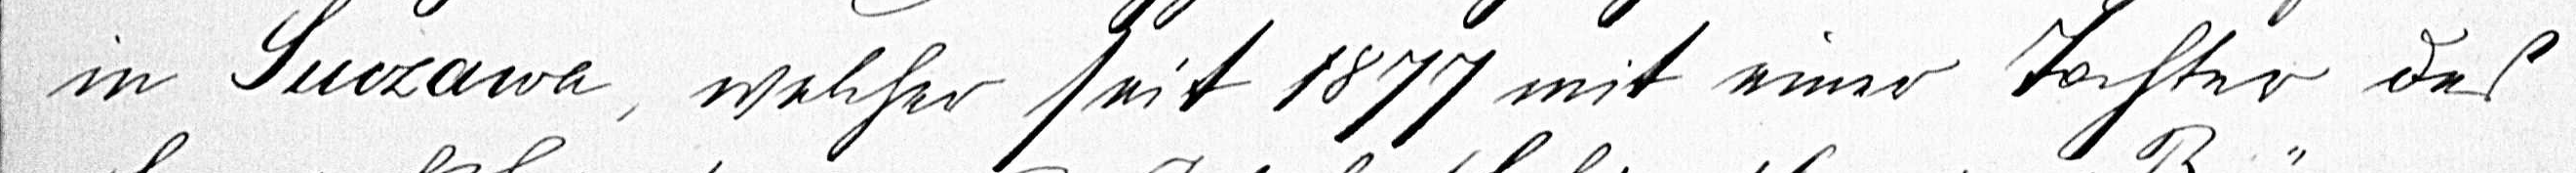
in Suczawa, welcher seit 1877 mit einer Tochter des
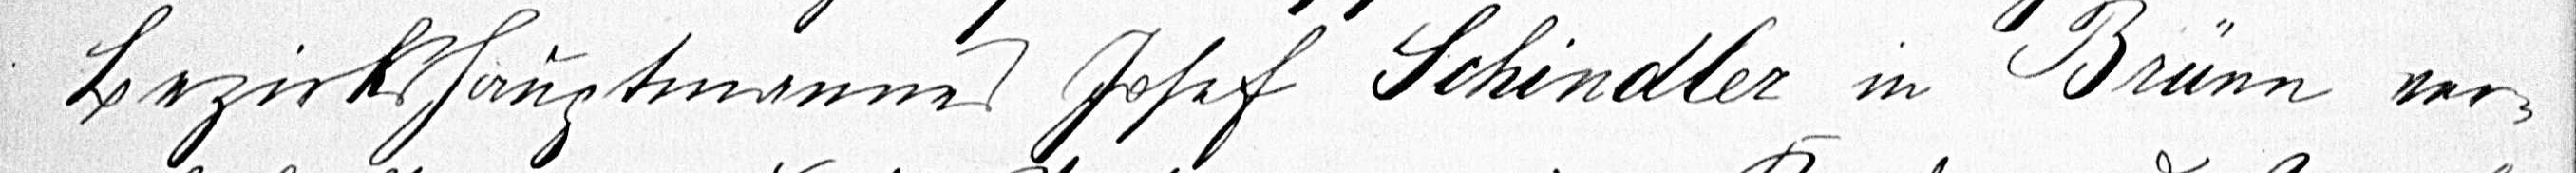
Bezirkshauptmannes Josef Schindler in Brünn ver¬
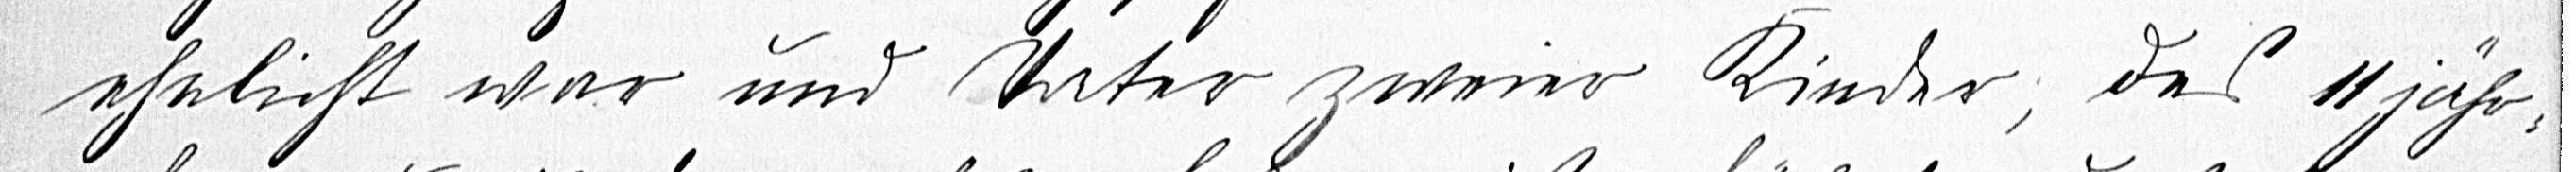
ehelicht war und Vater zweier Kinder, des 11 jähr:
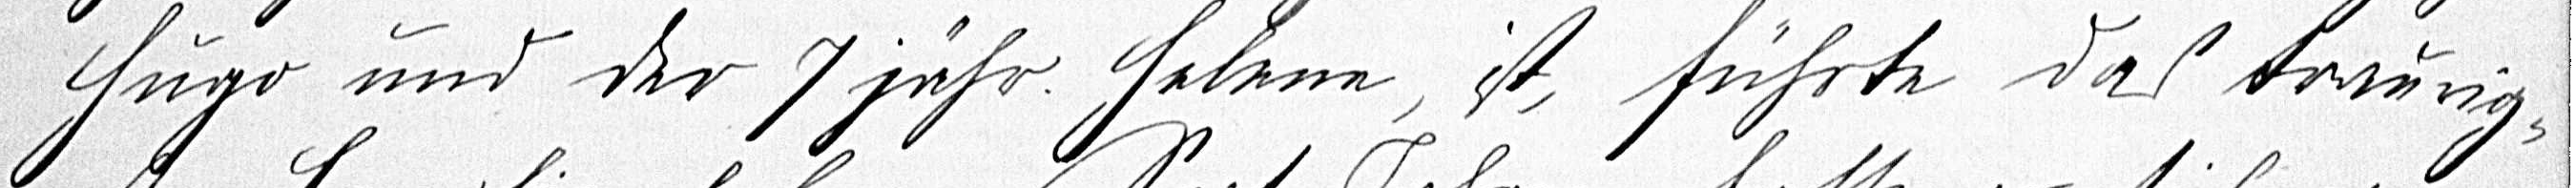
Hugo und der 7 jähr. Helene, ist, führte das traurig¬
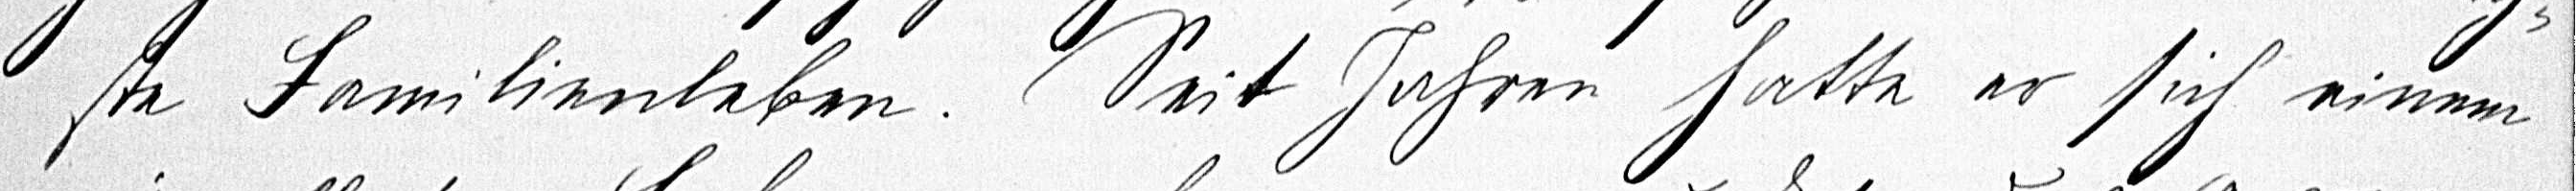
ste Familienleben. Seit Jahren hatte er sich einem
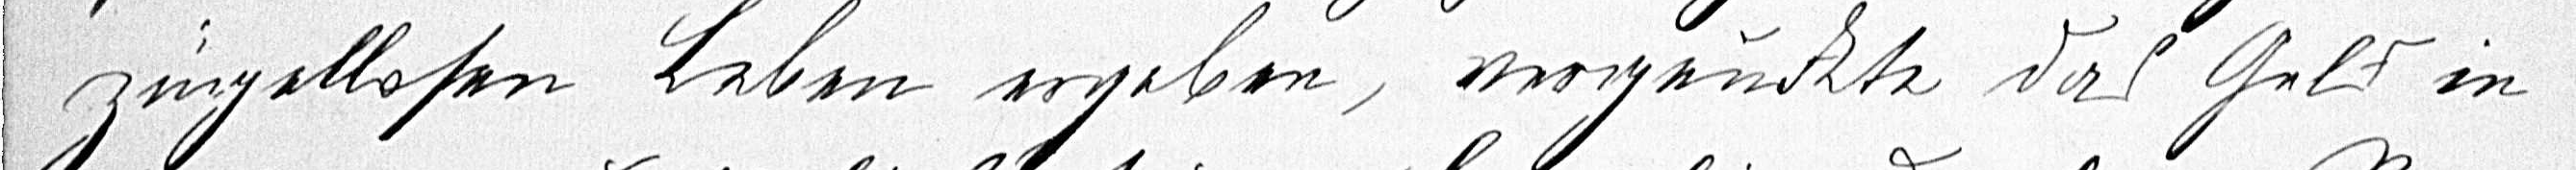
zügellosen Leben ergeben, vergeuckte das Geld in
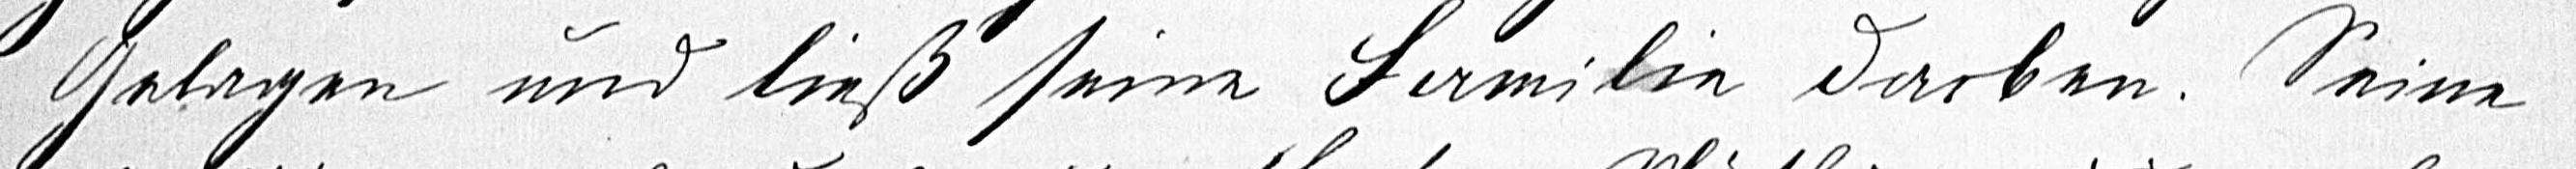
Gelagen und ließ seine Familie darben. Seine
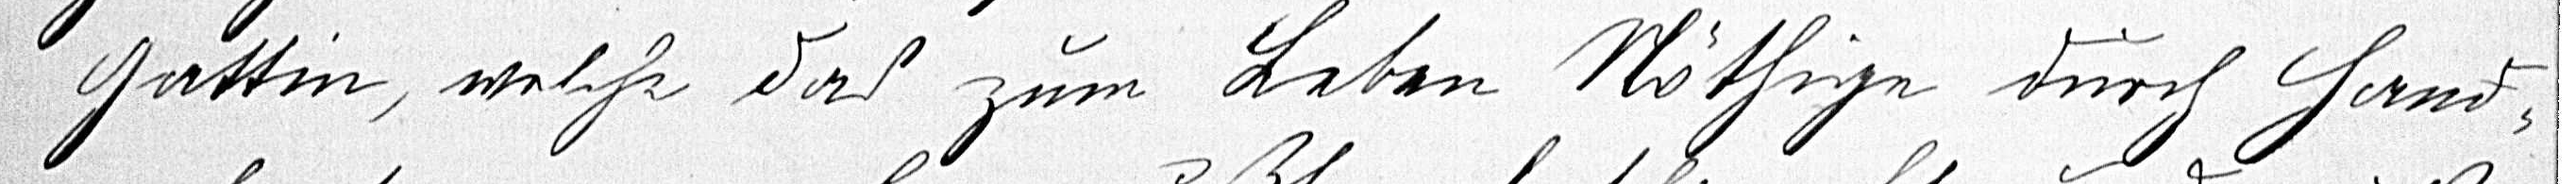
Gattin, welche das zum Leben Nöthige durch Hand¬
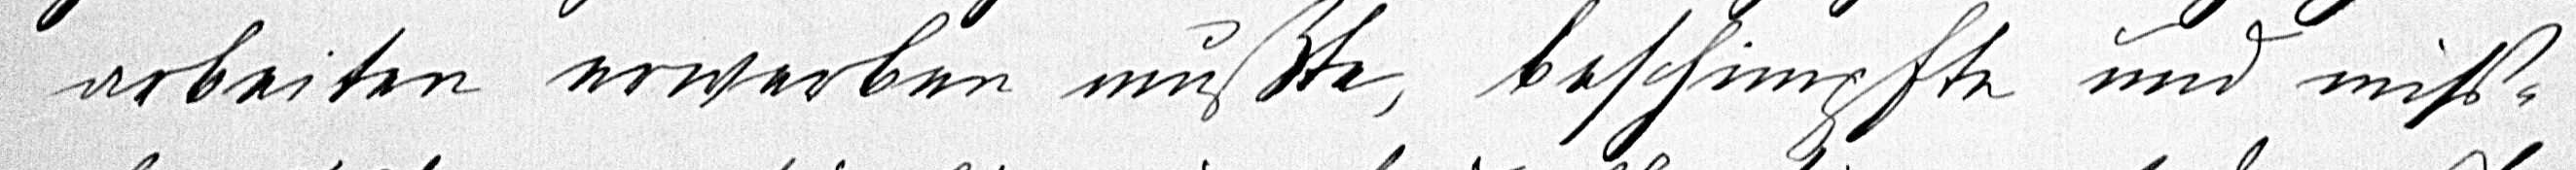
arbeiten erwerben mußte, beschimpfte und miss¬
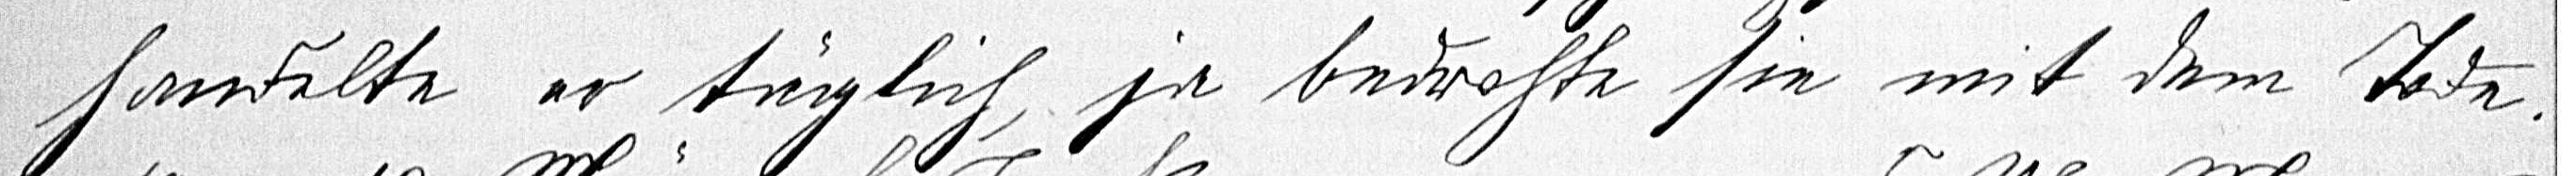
handelte der täglich, ja bedrohte sie mit dem Tode.
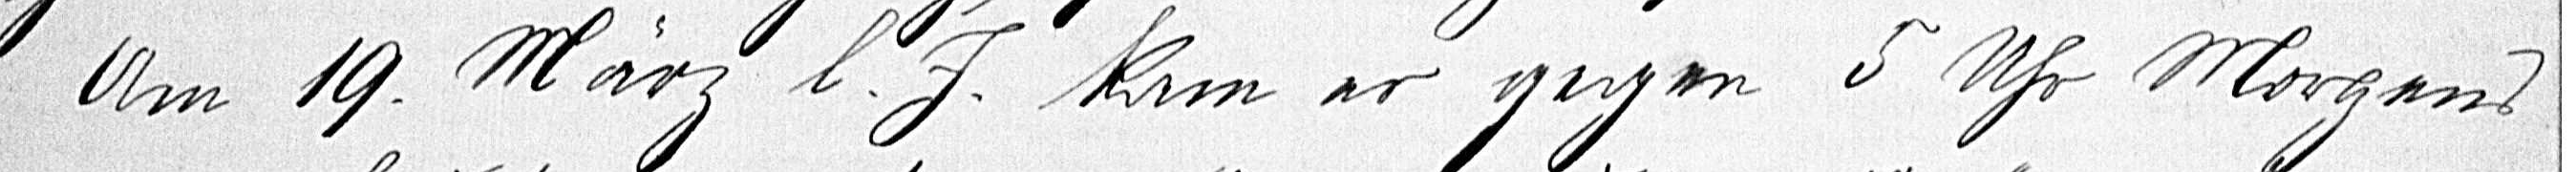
Am 19. März l. J. kam er gegen 5 Uhr Morgens
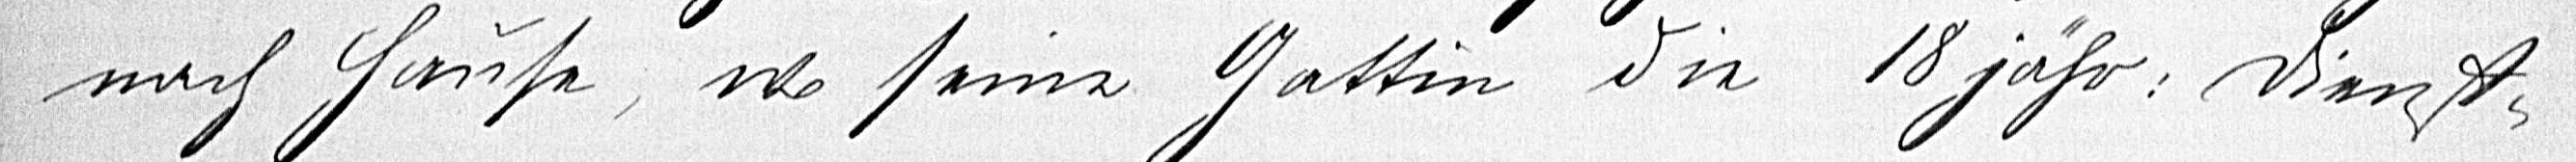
nach Hause, wo seine Gattin die 18jähr: Dienst¬
